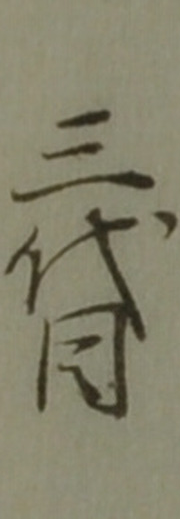三代目
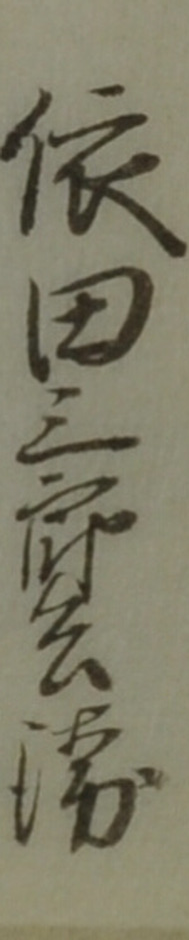依田三郎兵衛
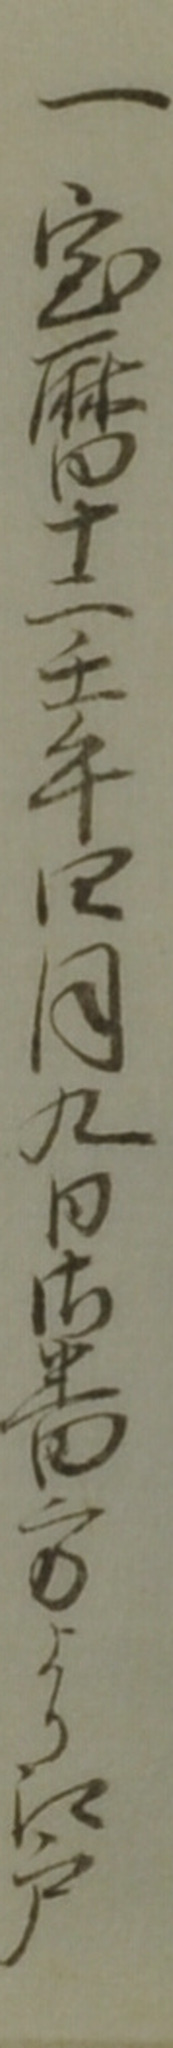一宝暦十二壬午四月九日御番方より江戸
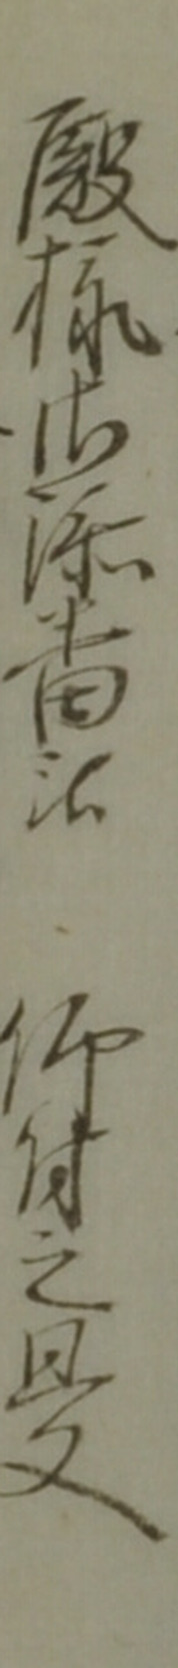殿様御添番被仰付之且又
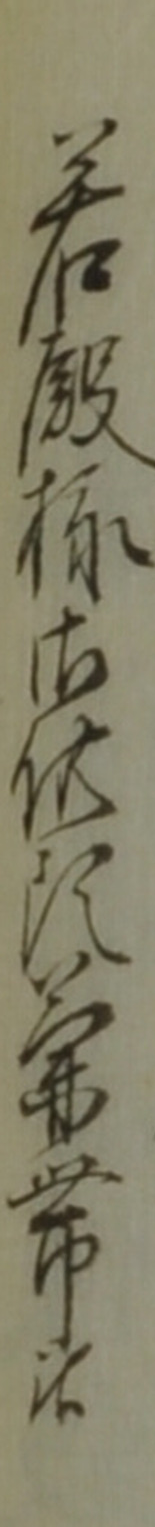若殿様御供頭兼帯被
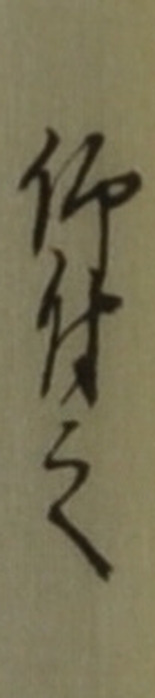仰付之
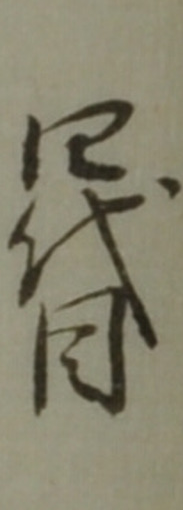四代目
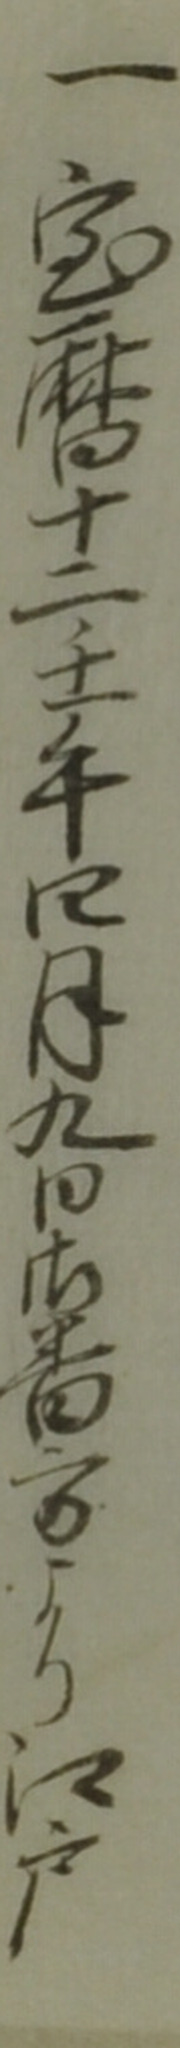一宝暦十二壬午四月九日御番方より江戸
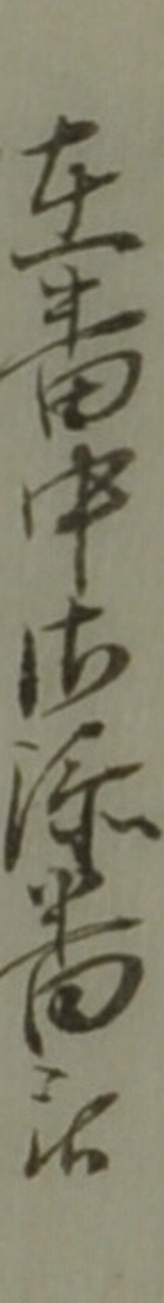在番中御添番被
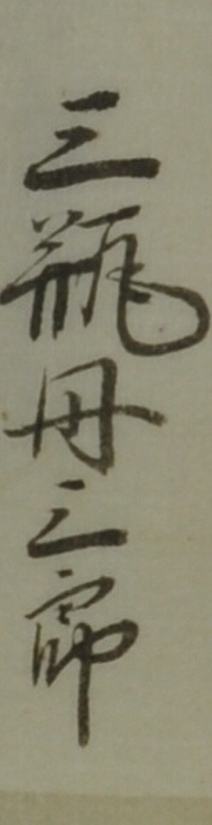三瓶丹三郎
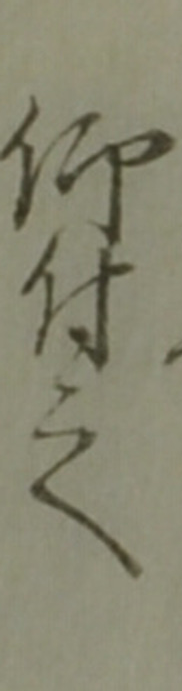仰付之
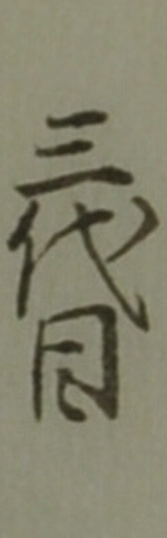三代目
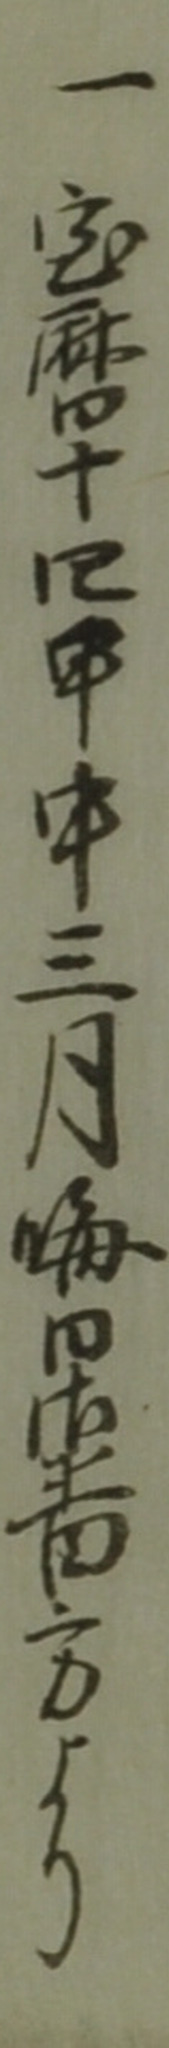一宝暦十四甲申三月晦日御番方より
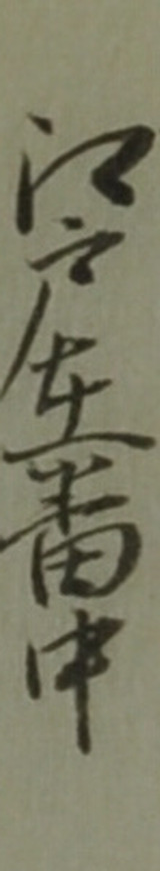江戸在番中
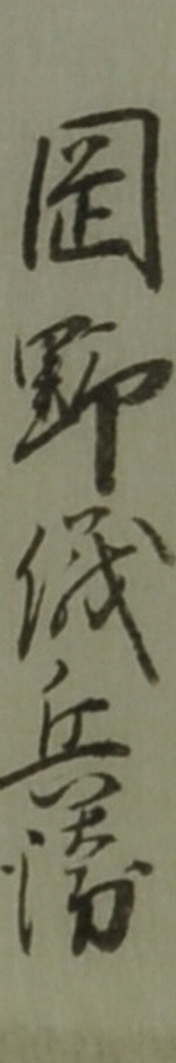岡野儀兵衛
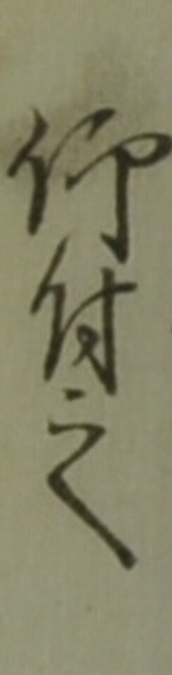仰付之
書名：諸御役代々録（八）
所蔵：伊那市立高遠町図書館・合同会社AMANE
